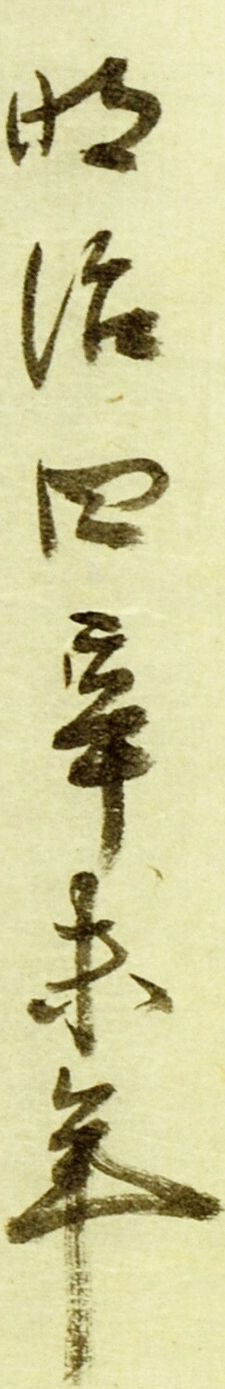明治四辛未年
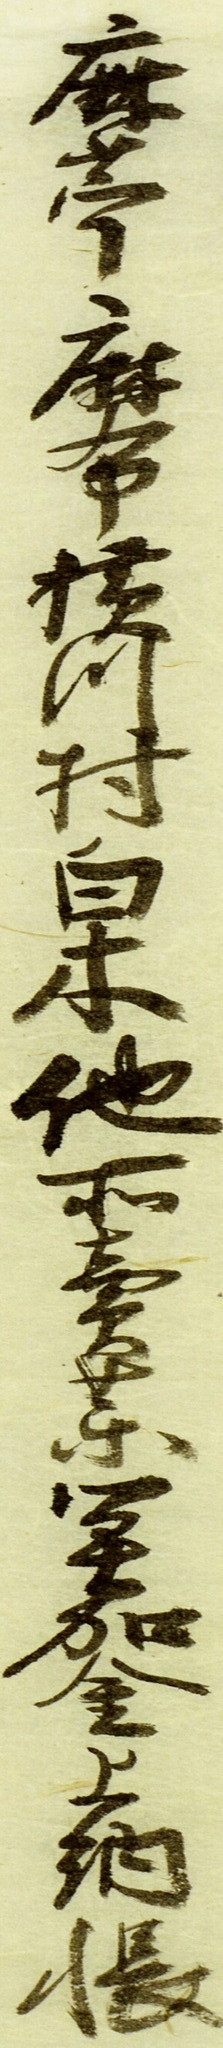麻苧麻布横川村白木他所売薬冥加金上納帳
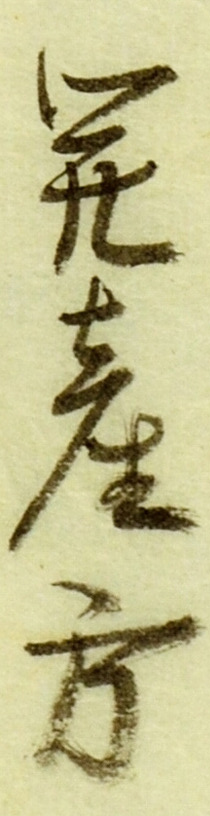開産方
